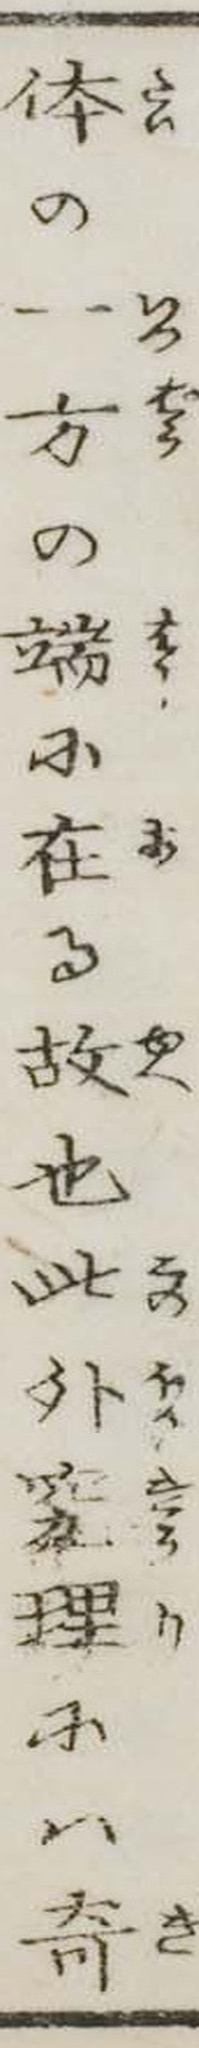体の一方の端に在る故也此外究理には奇
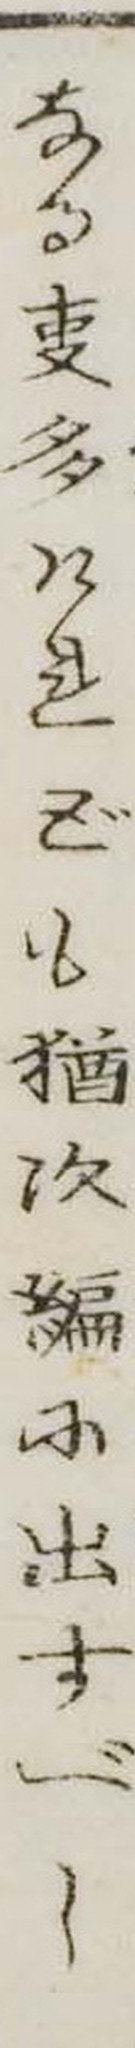なる叓多けれども猶次編に出すべし
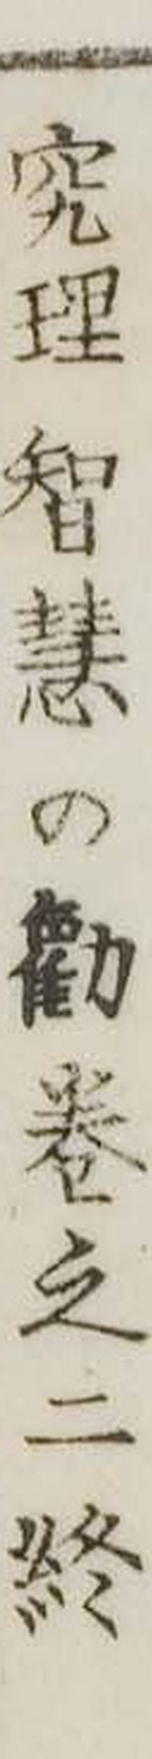究理智慧の勧巻之二終
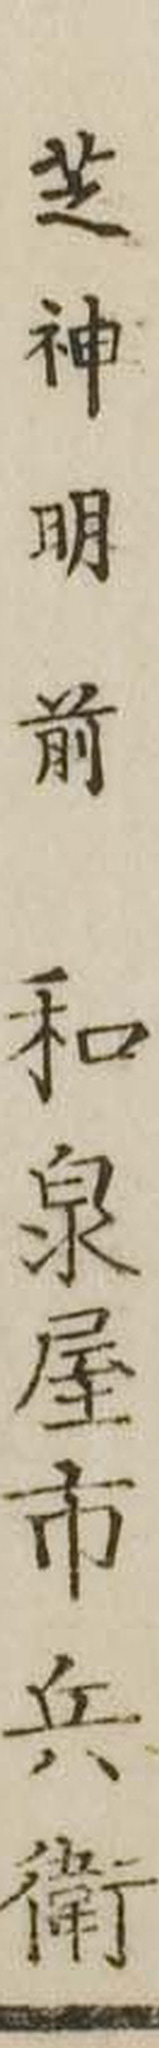芝神明前和泉屋市兵衛
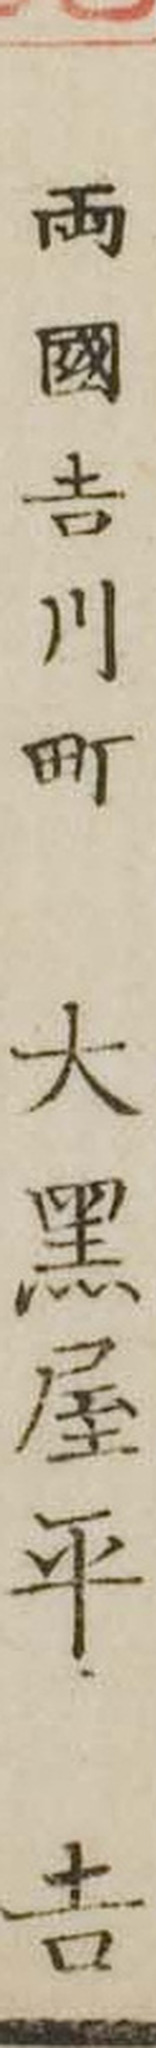両國吉川町大黒屋平吉
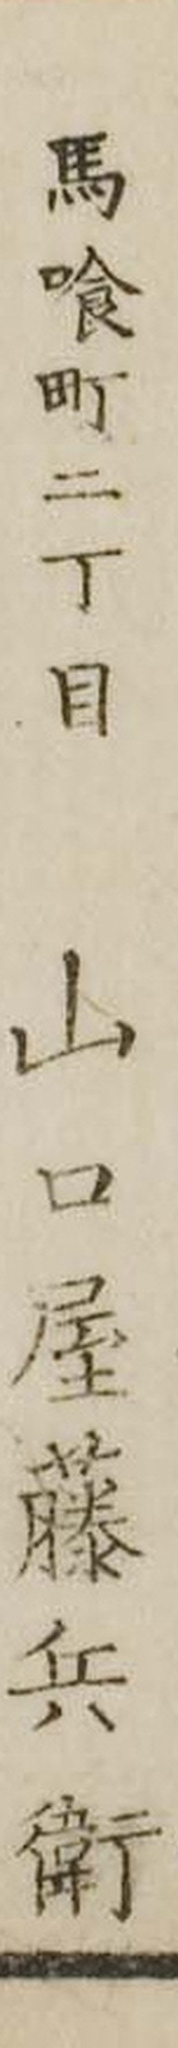山内馬喰町二丁目山口屋藤兵衛
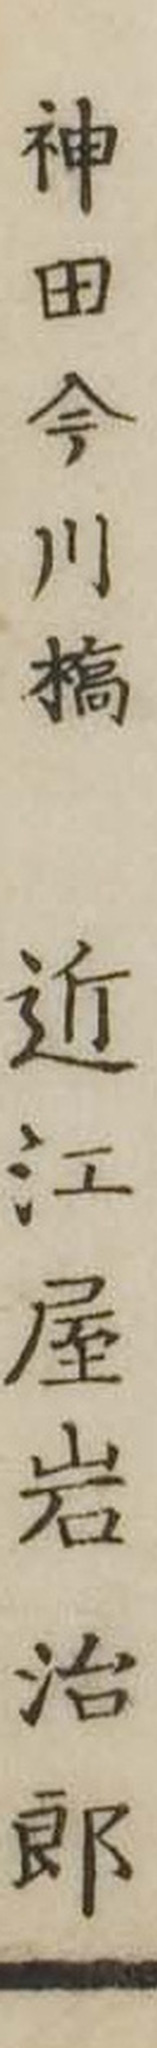神田今川橋近江屋岩治郎
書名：究理知慧の勧 : 訓蒙画入 巻之2
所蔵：東京学芸大学附属図書館
